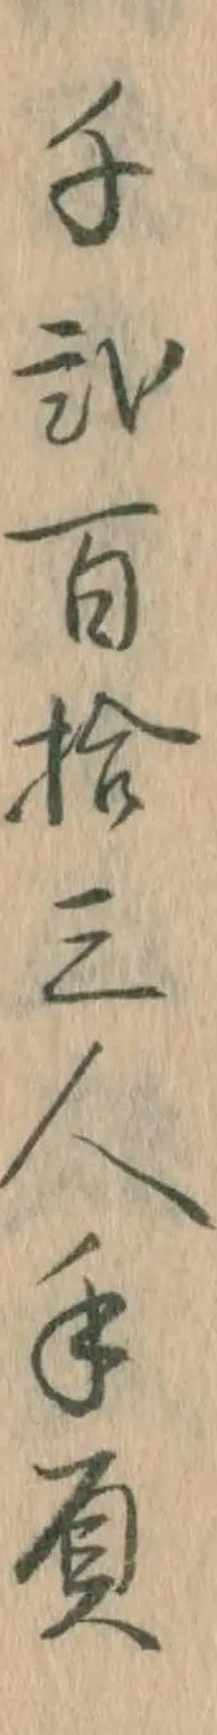千弐百拾三人手負
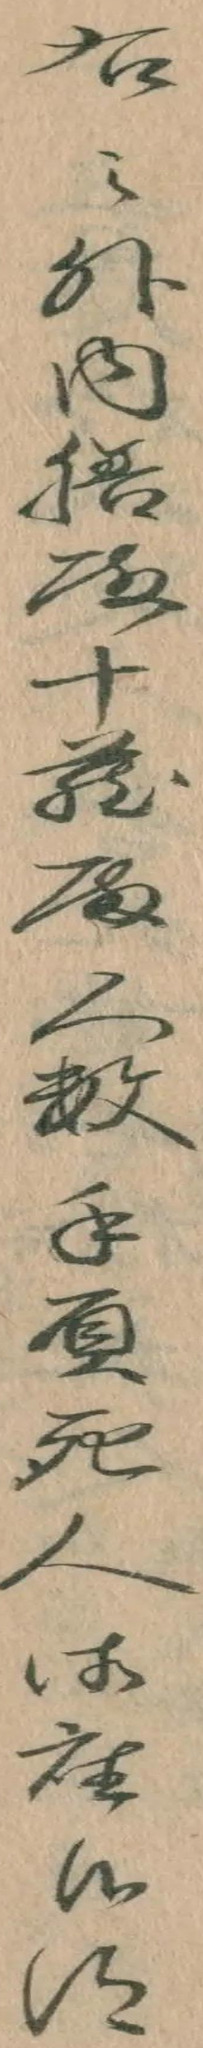右之外内膳殿十蔵殿人数手負死人御座候得
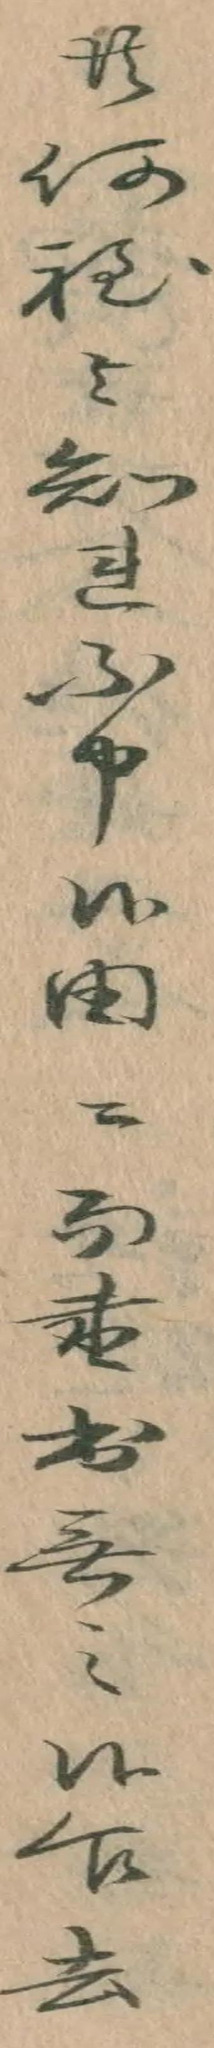共何程与知連ふ申候由に而書出無之候乍去
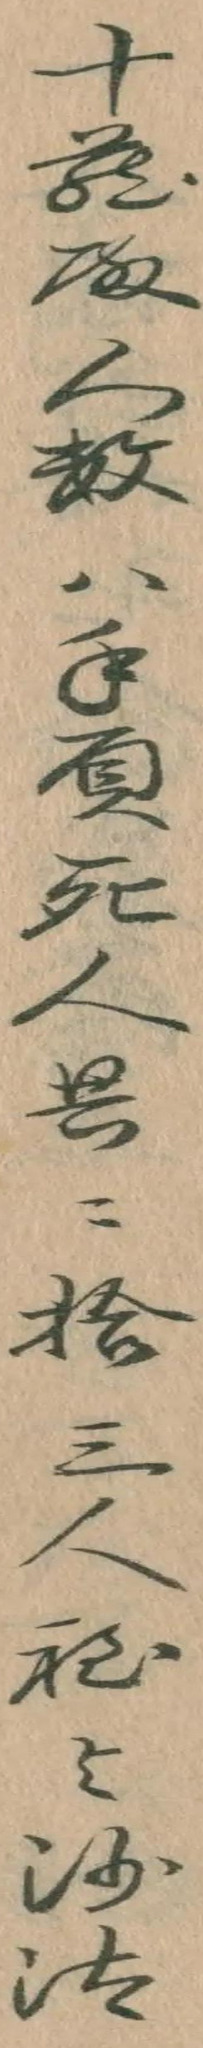十蔵殿人数は手負死人共に拾三人程与沙汰
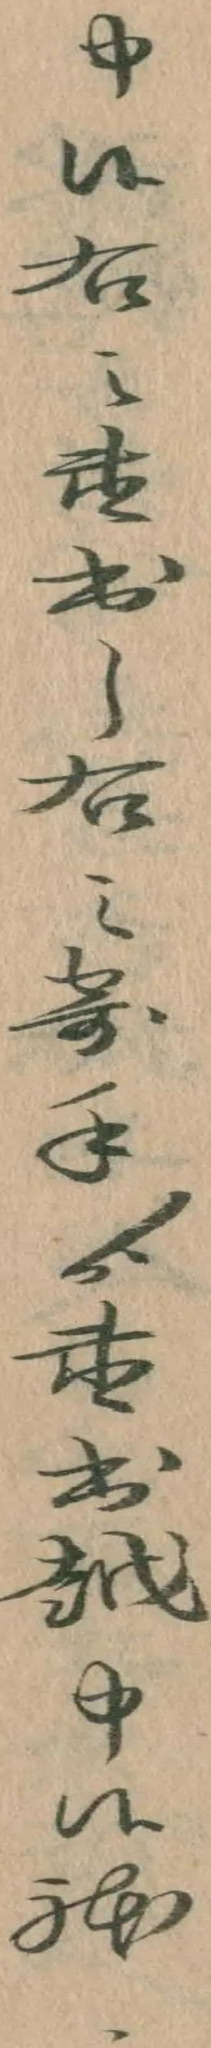申候右之書出し右之寄手ゟ書出越申候躰に
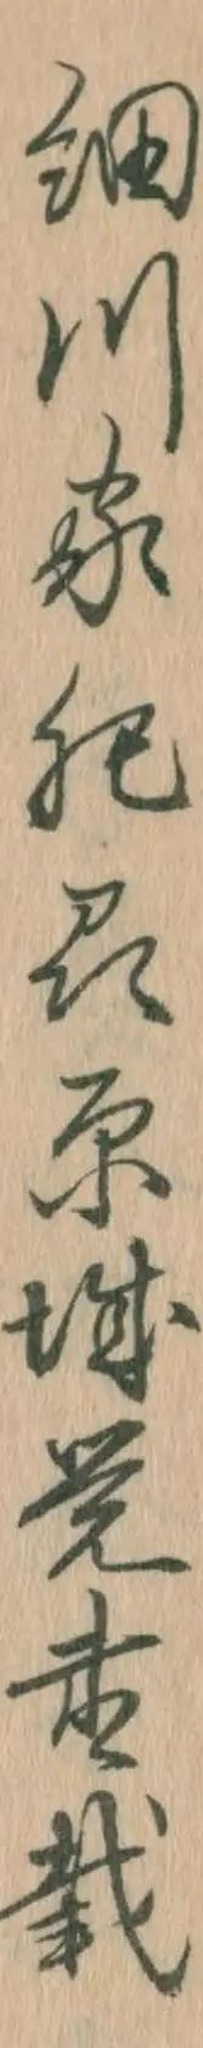細川家肥州原城覚書載
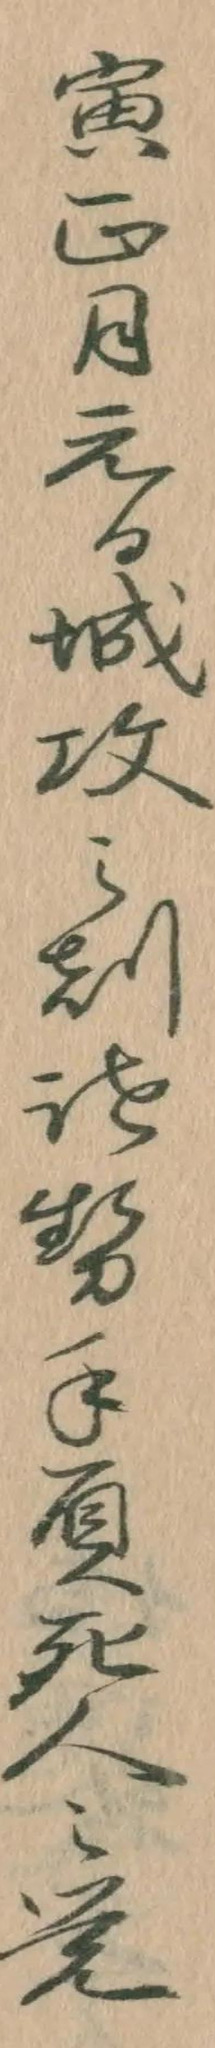寅正月元日城攻之刻諸勢手負死人之覚
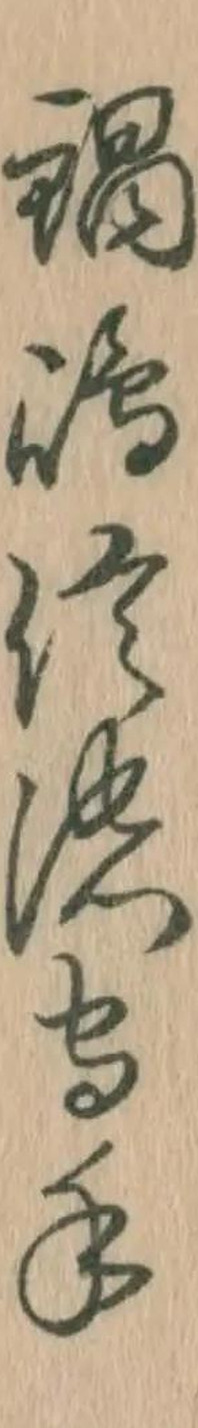鍋島信濃守手
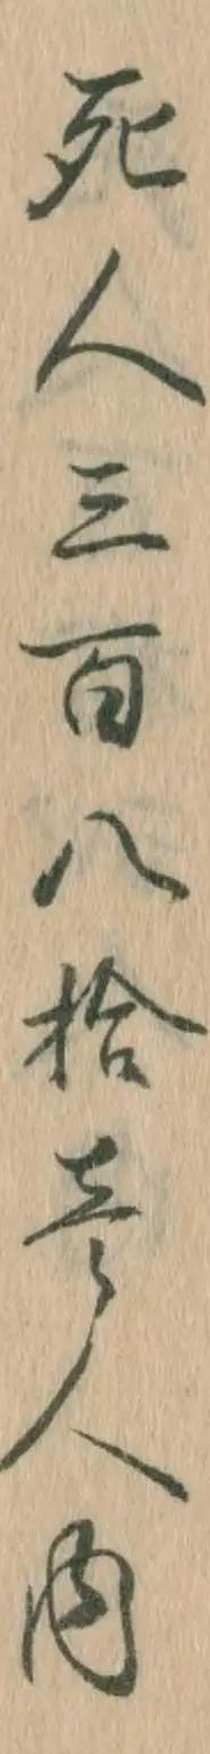死人三百八拾壱人内
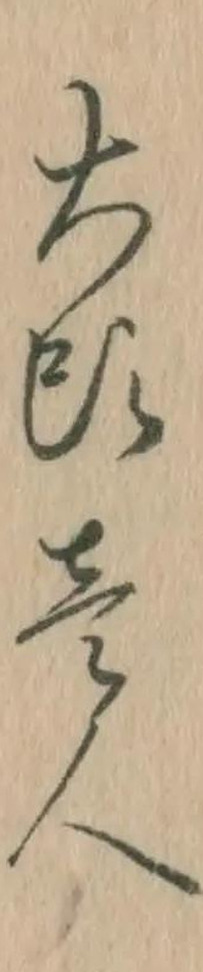大頭壱人
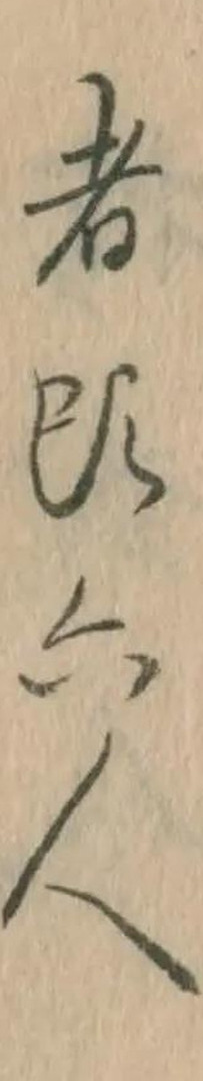者頭六人
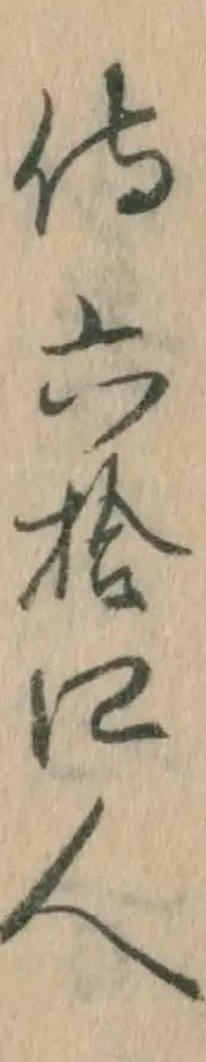侍六拾四人
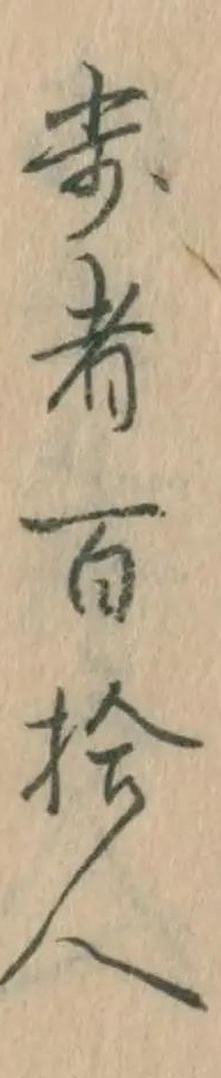歩者百拾人
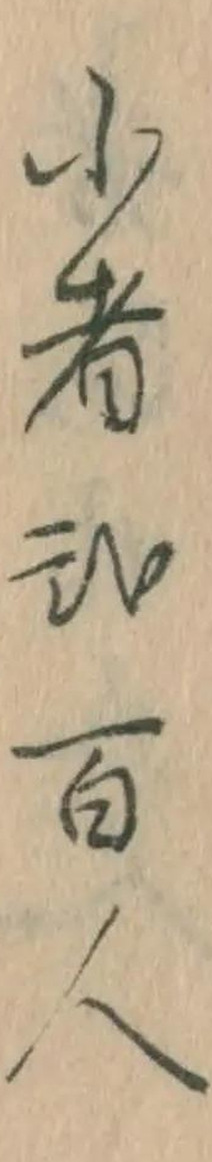小者弐百人
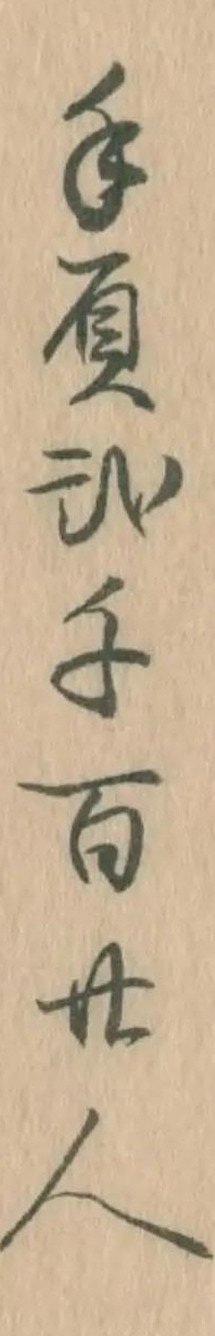手負弐千百廿人

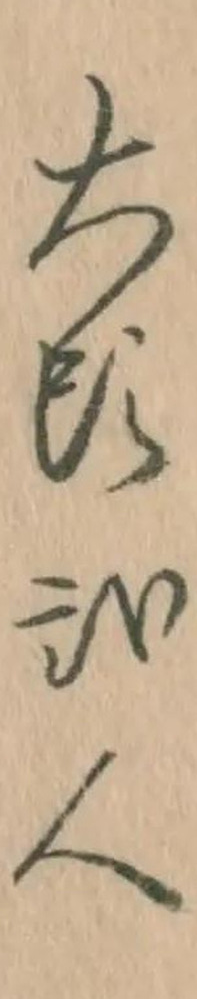大頭弐人
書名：切支丹御退治記 49巻. [5]
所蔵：国立国会図書館 National Diet Library, JAPAN
